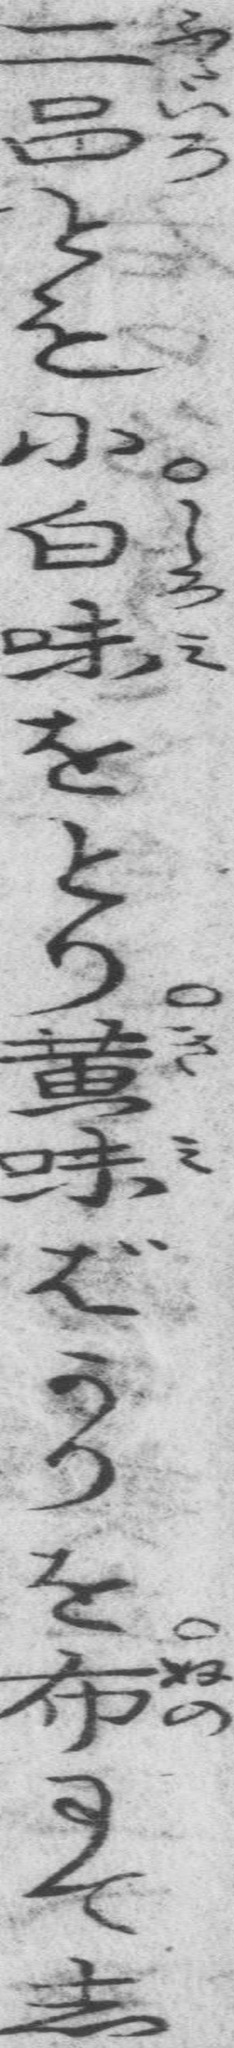二品ともに。白味をとり。黄味ばかりを。布にてし
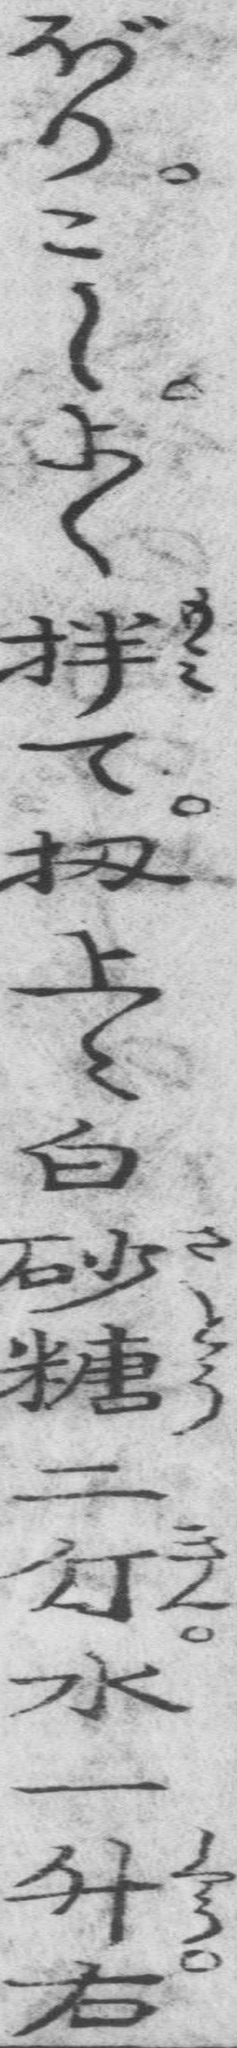ぼり。こし。よく拌て。扨上々白砂糖二斤。水一升。右
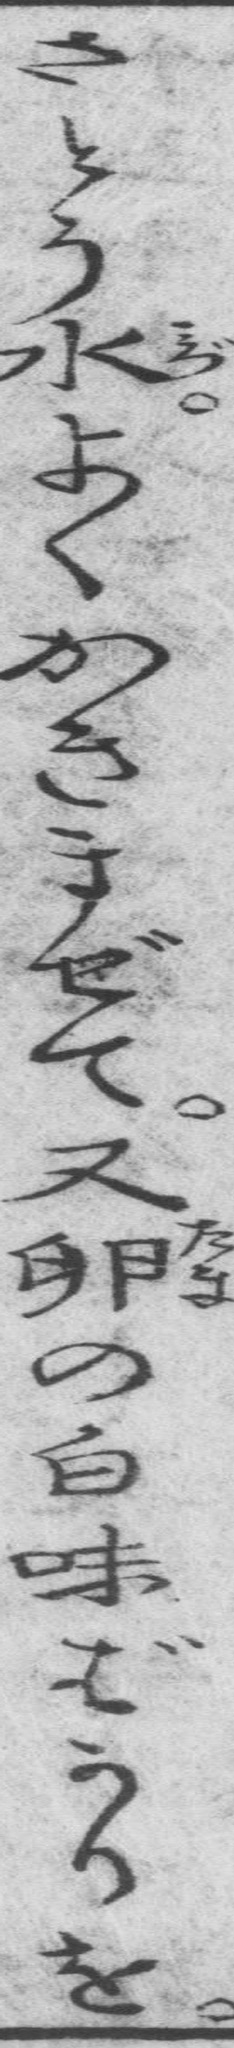さとう水。よくかきまぜて。又卵の白味ばかりを。

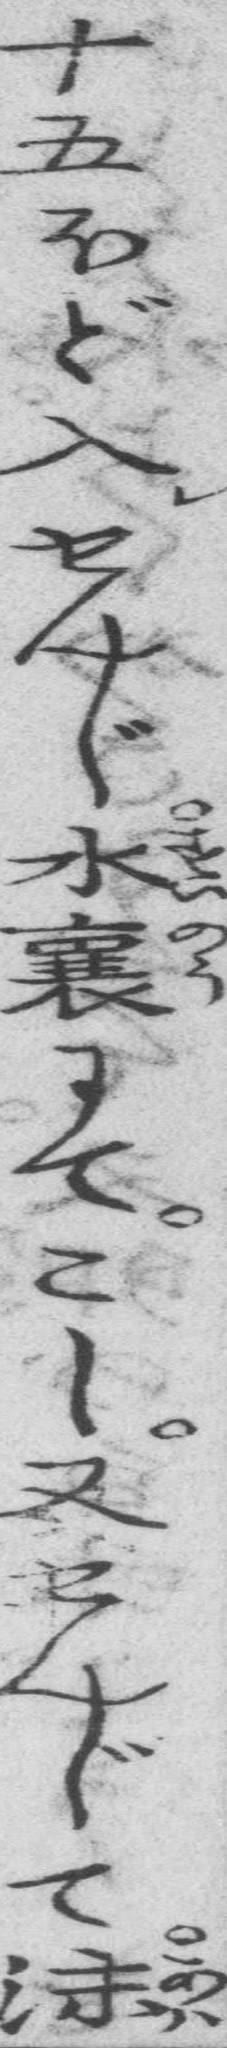十五ほど入れせんじ。水嚢にて。こし。又せんじて。沫
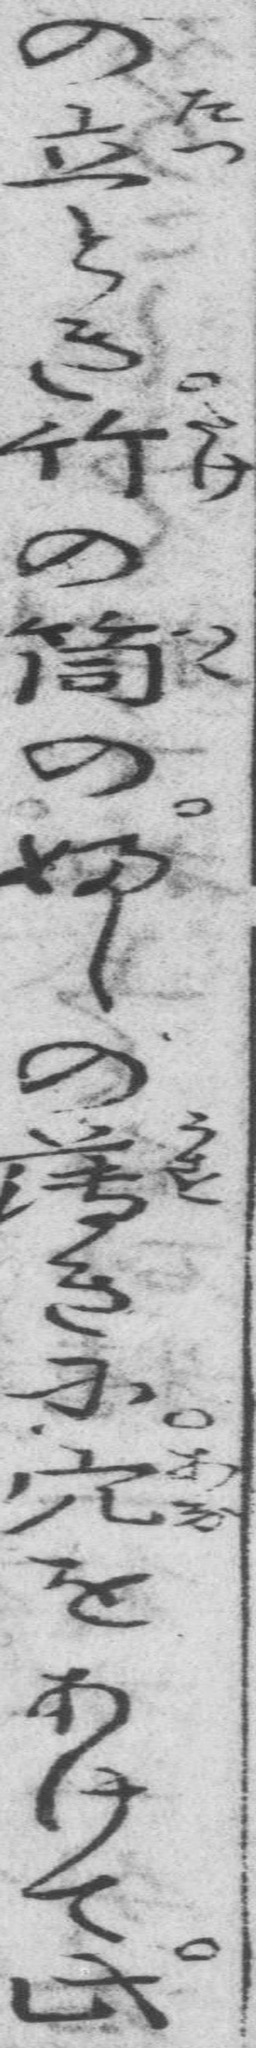の立とき。竹の筒の。ふしの薄きに。穴をあけて。此
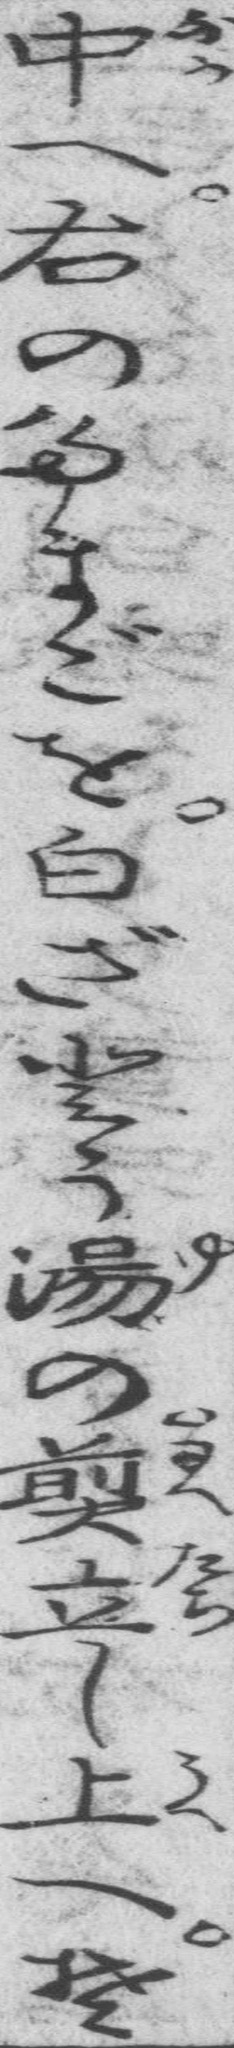中へ。右のたまごを。白ざとう湯の。煎立し上へ。そ
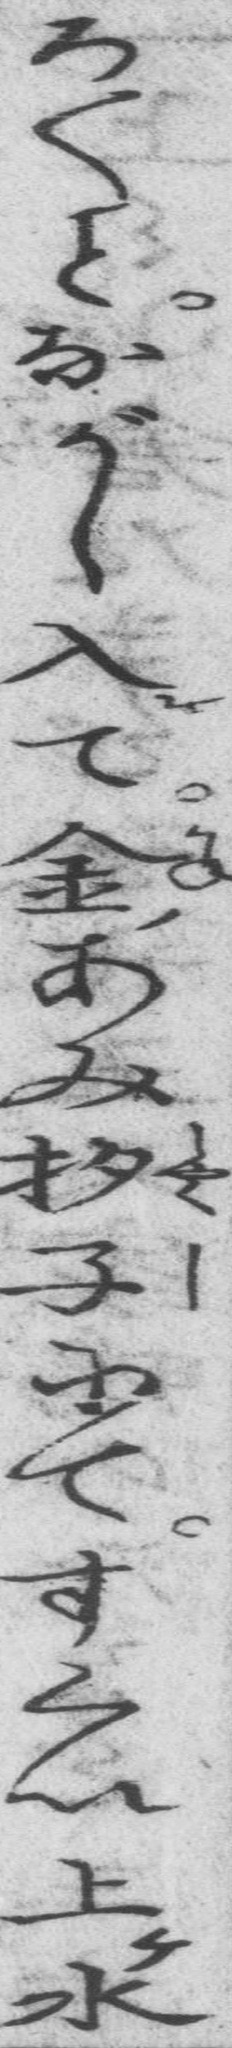ろ〳〵と。ながし入れて。金のあみ杓子にて。すくい上け水
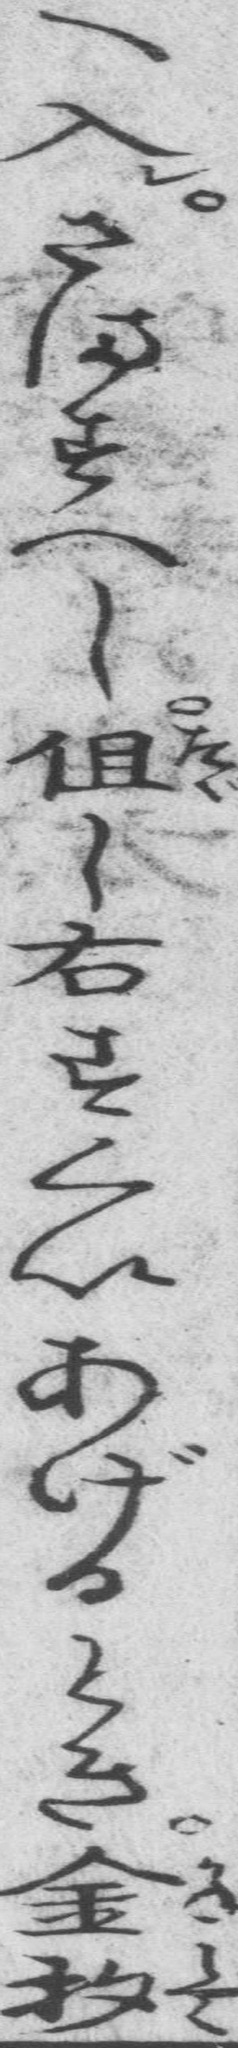へ入れ。さますへし。但し右すくいあげるとき。金杓
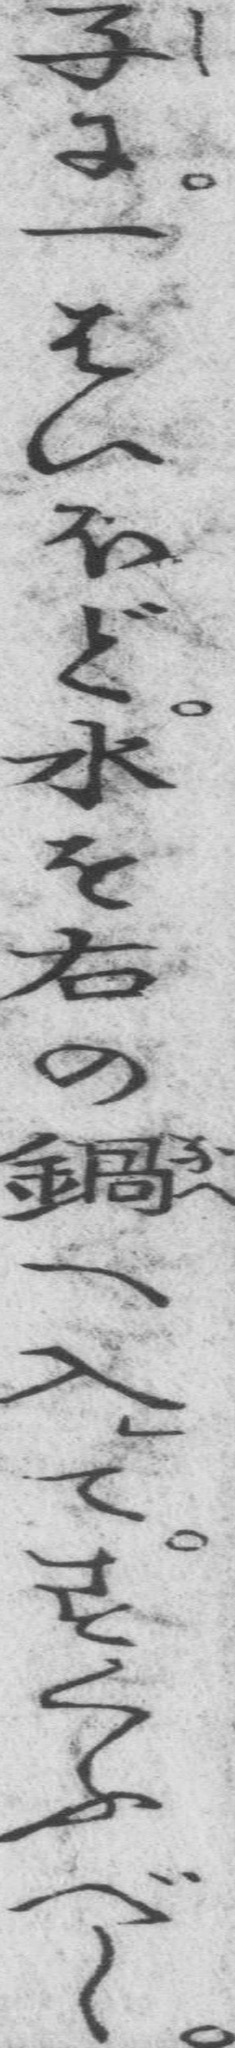子に。一はいほど。水を右の鍋へ入れて。すくふべし。
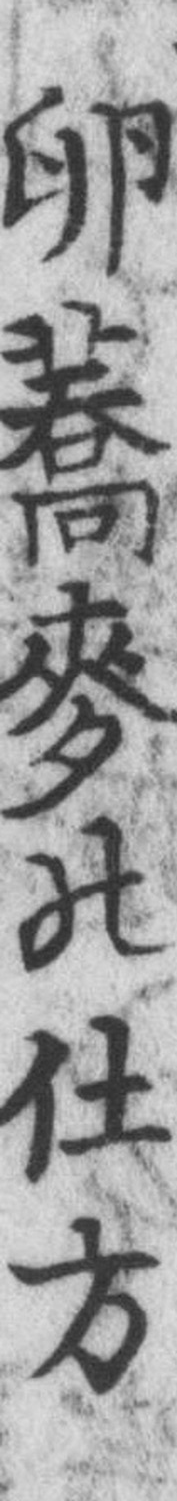卵蕎麦の仕方
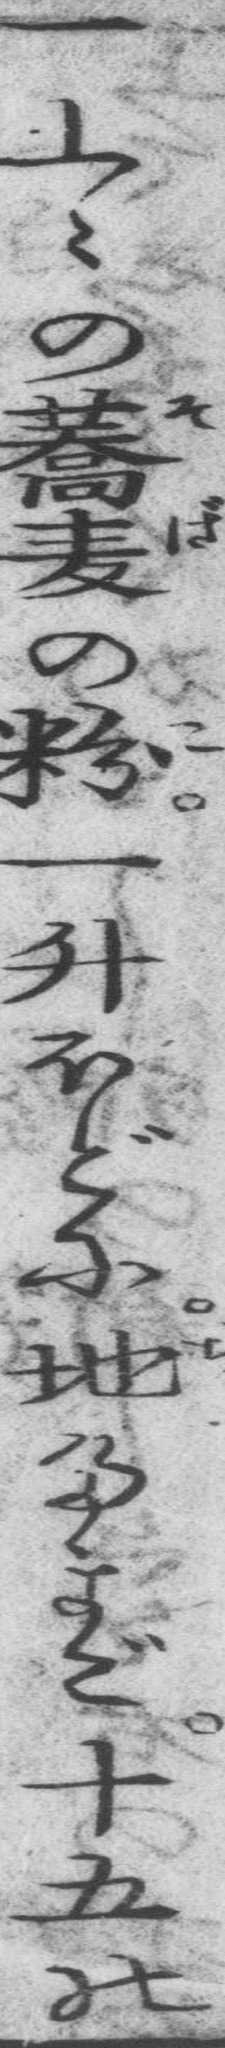一山々の蕎麦の粉。一升ほどに。地たまご。十五の
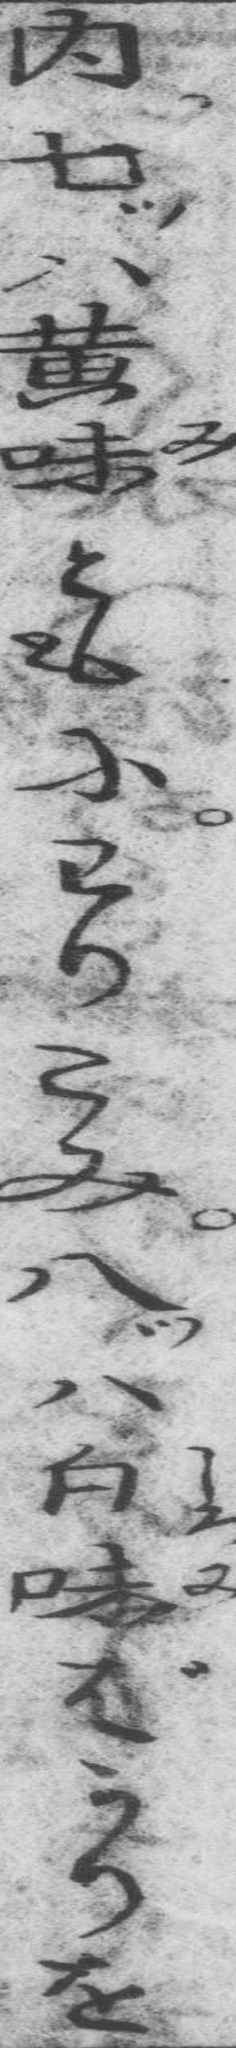内。七ツは黄味ともに。わりこみ。八ツは白味ばかりを
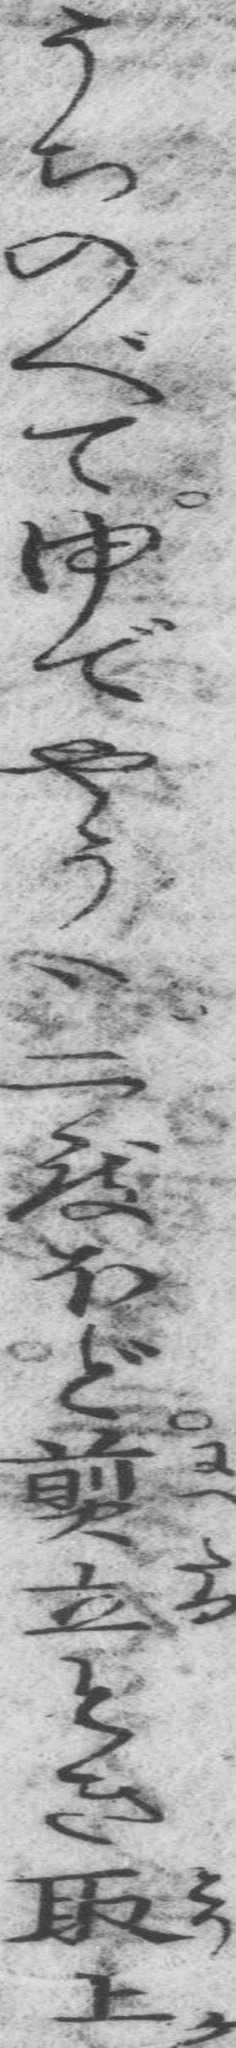うちのべて。ゆでやうは。二度ほど。煎立とき取上け
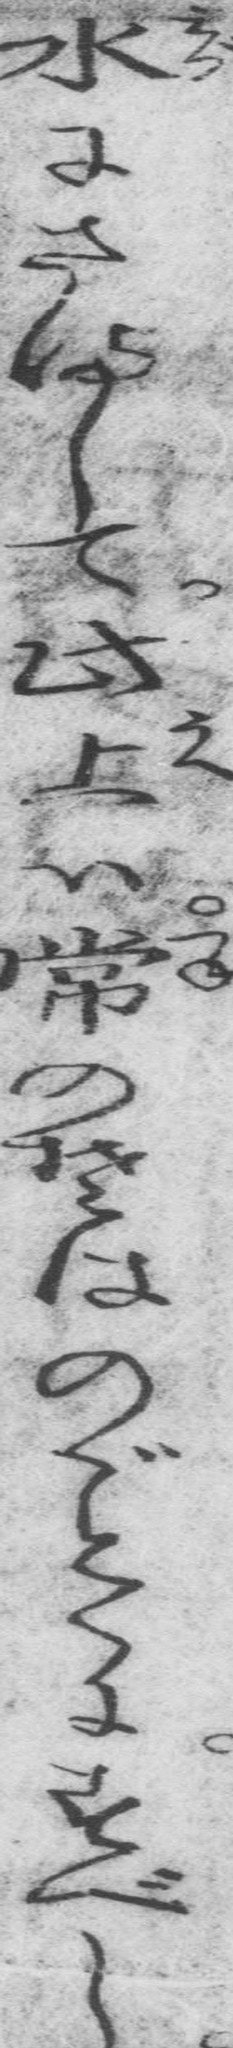水にさまして。此上は。常のそはのごとくに。すべし。
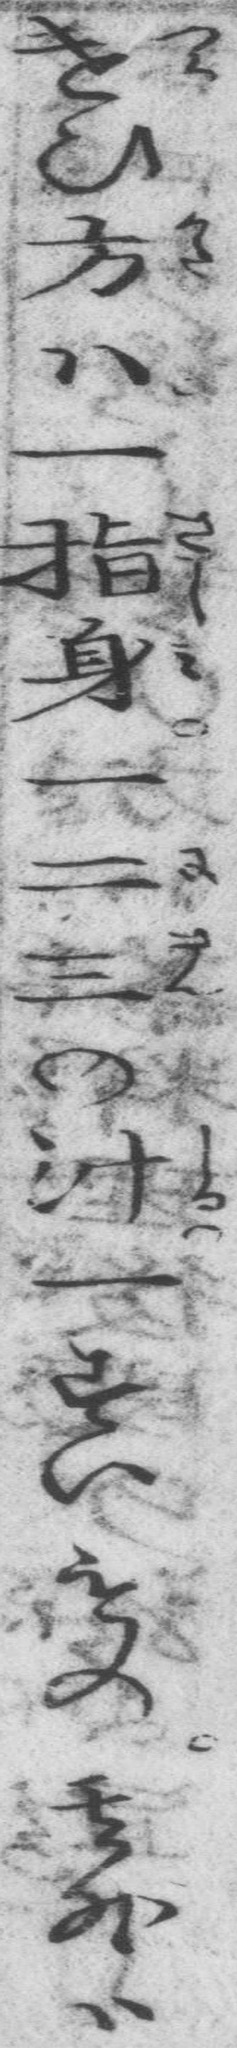遣ひ方は。一指身。一二三の汁。一すいもの。其外は
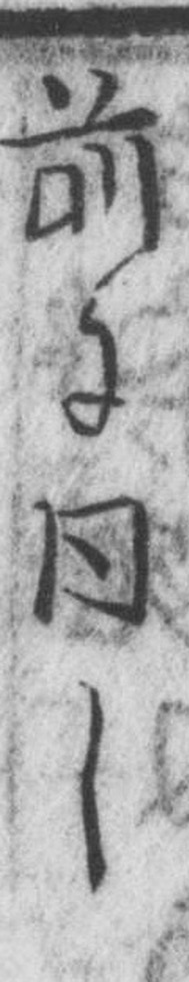前に同し
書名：萬寳料理秘密箱
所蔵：大阪府立大学学術情報センター 国文学研究資料館
